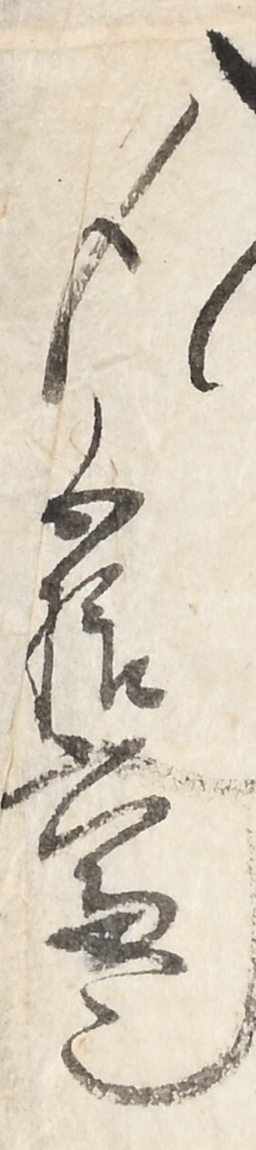〆五拾六両也

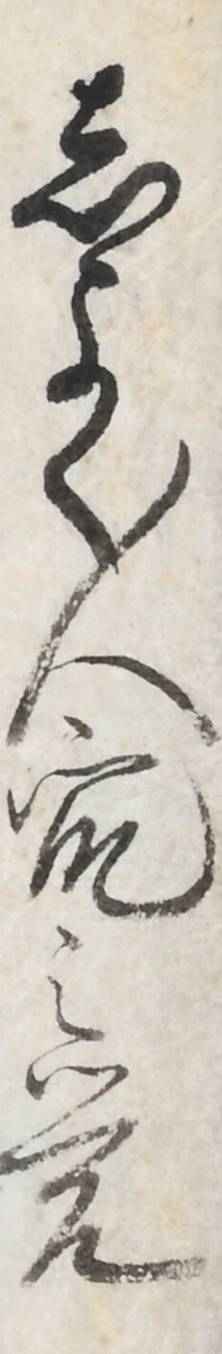しよく人衆之覚
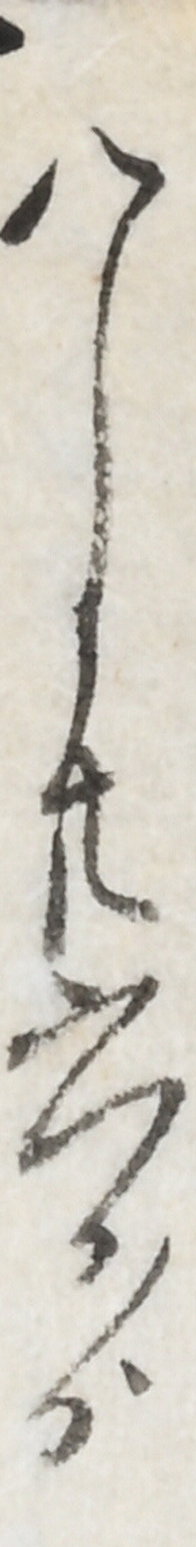八月廿六日ゟ
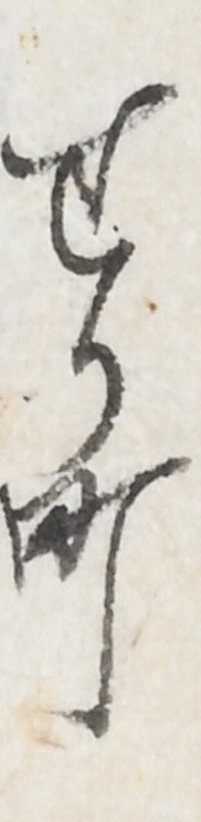せり町
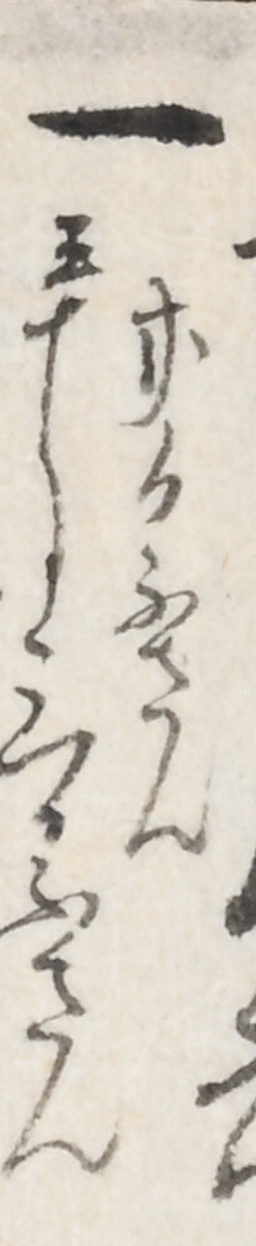一廿二日ふさん
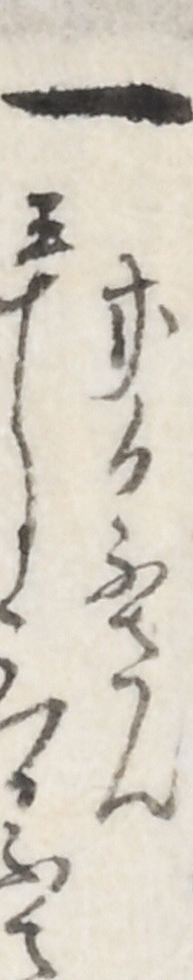一廿二日ふさん
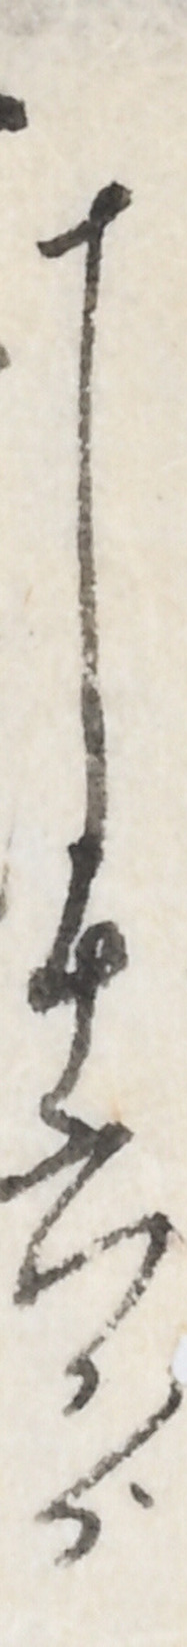十月十六日ゟ
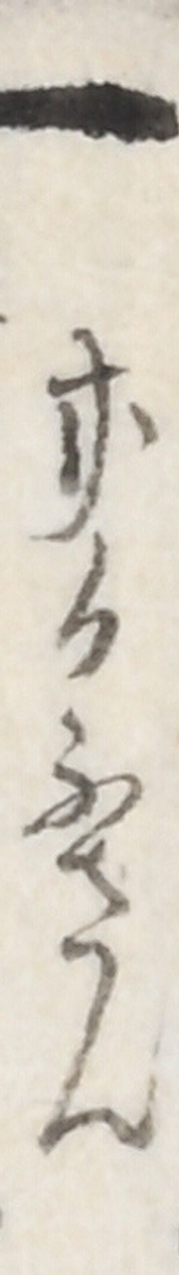一廿日ふさん
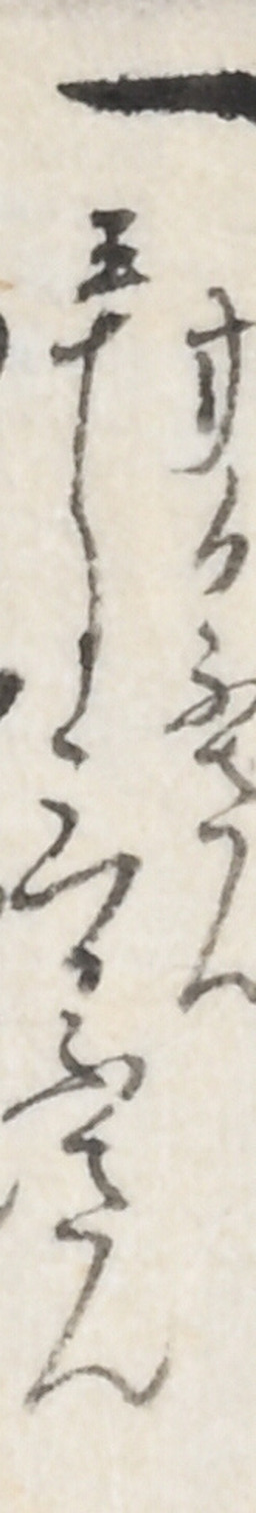閏十月三日ふさん
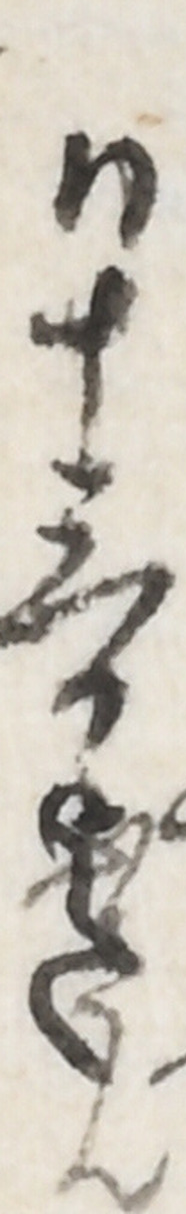同十三日迄
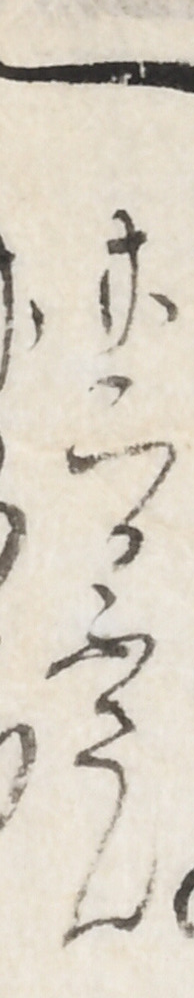一廿二日ふさん
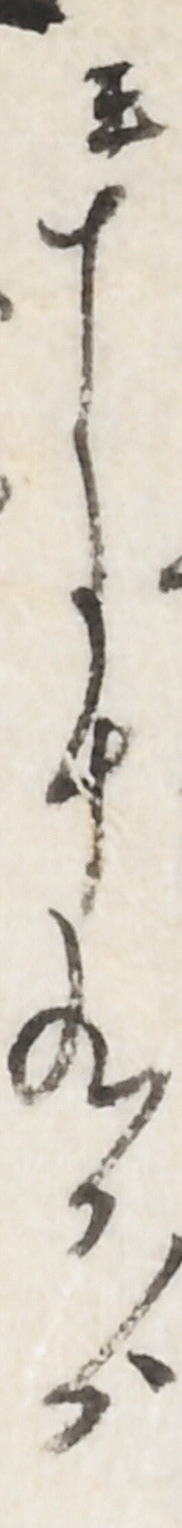閏十月十九日ゟ
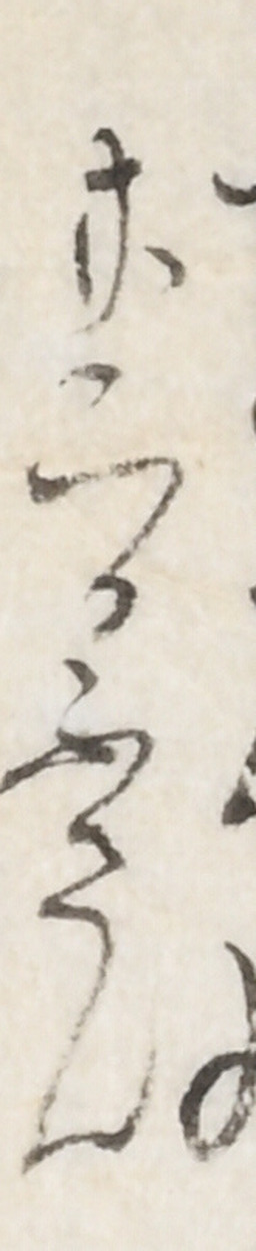一廿二日ふさん
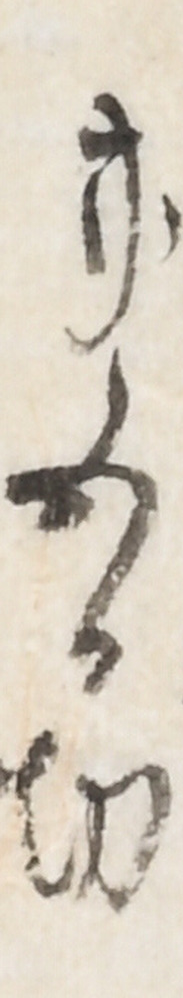廿五日切
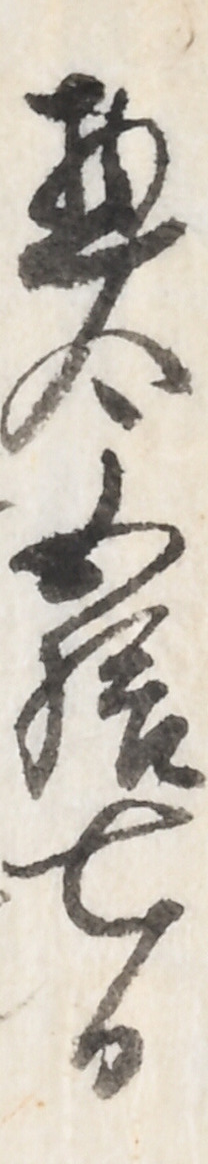惣合五拾七日
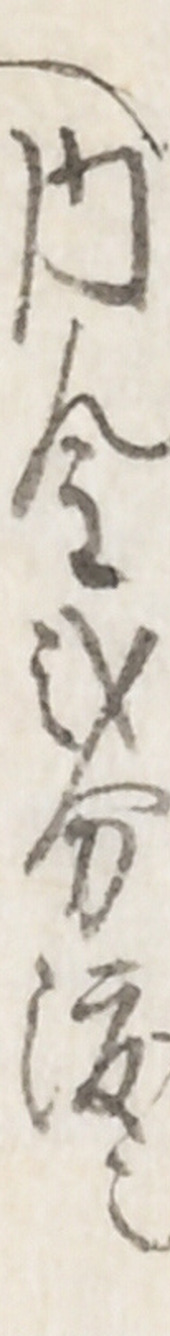内金弐分渡し
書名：合力覚帳
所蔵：伊那市立高遠町図書館・合同会社AMANE
